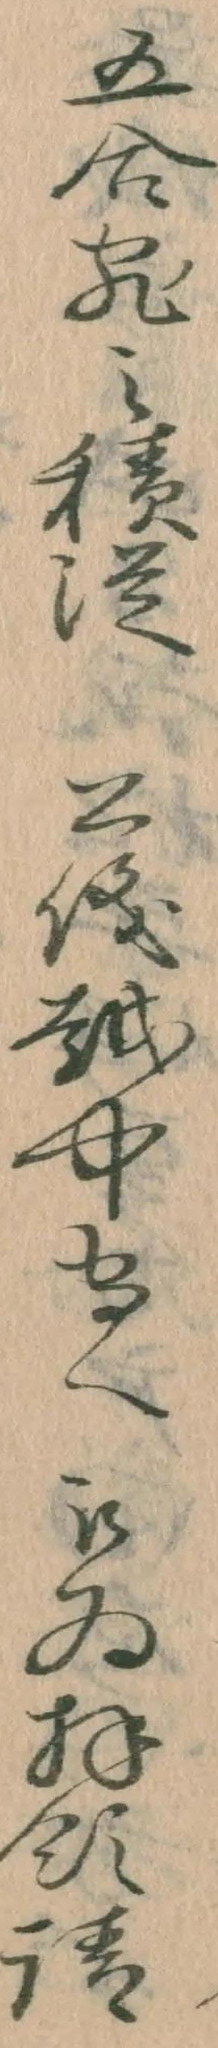五合究之積従公儀越中守へ被ゐ拝領請
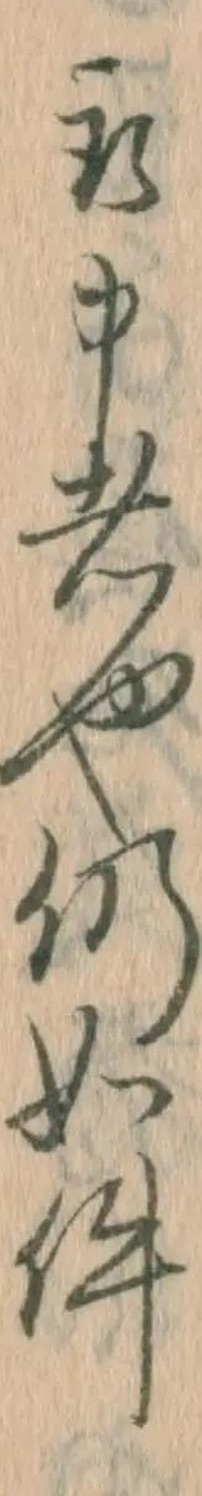取申者也仍如兼件
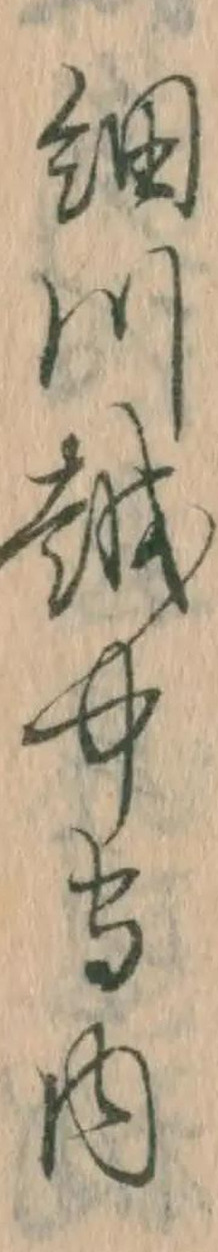細川越中守内
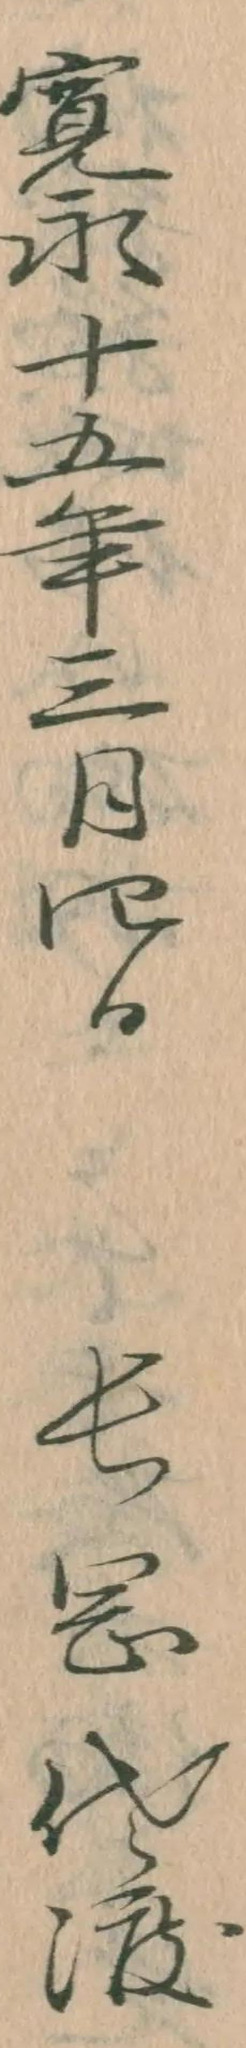寛永十五年三月四日長岡佐渡
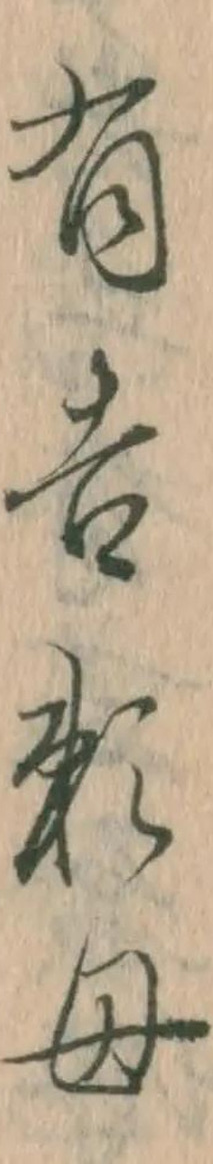有吉頼母
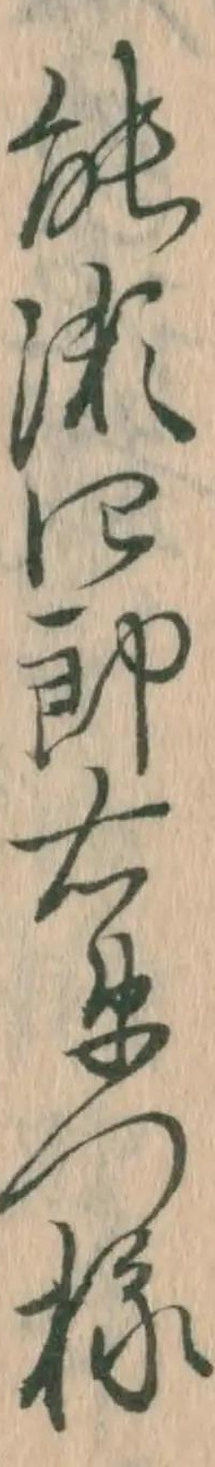能瀬四郎右衛門様
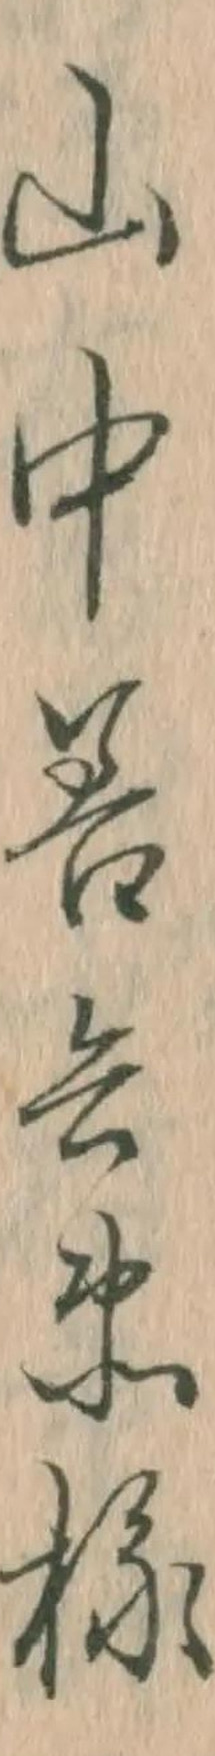山中善兵衛様
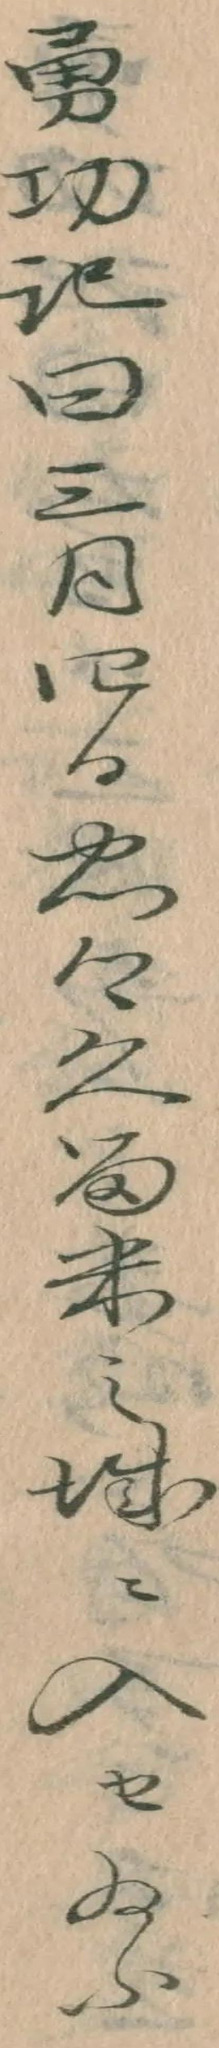勇功記曰三月四日忠郷久留米之城に入せゐふ
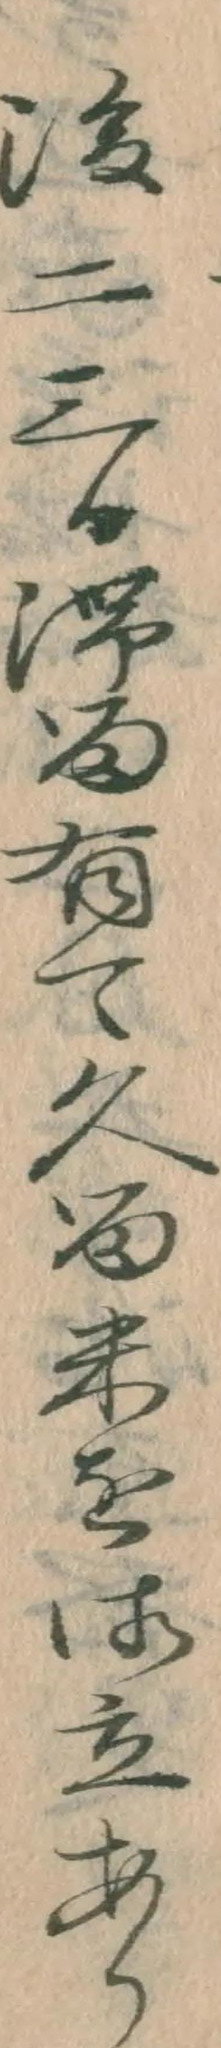後二三日滞留有て久留米を御立あり
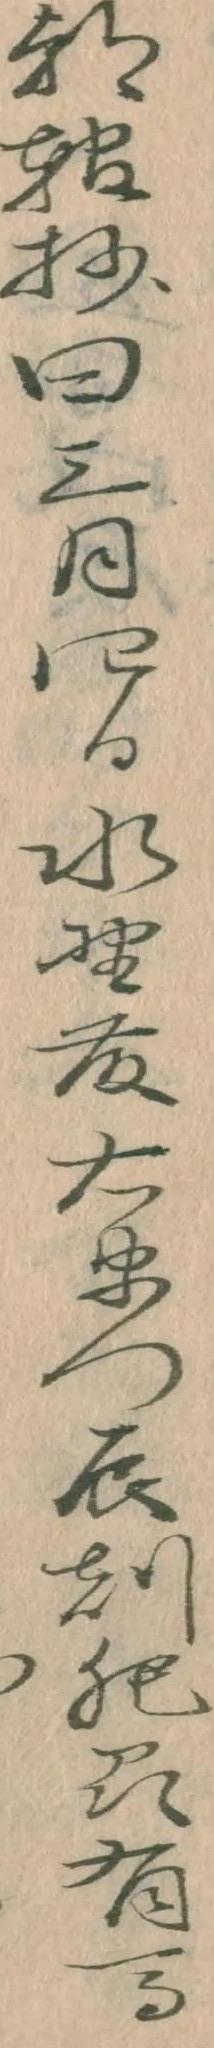朝報抄曰三月四日水野藤右衛門辰刻肥州有馬
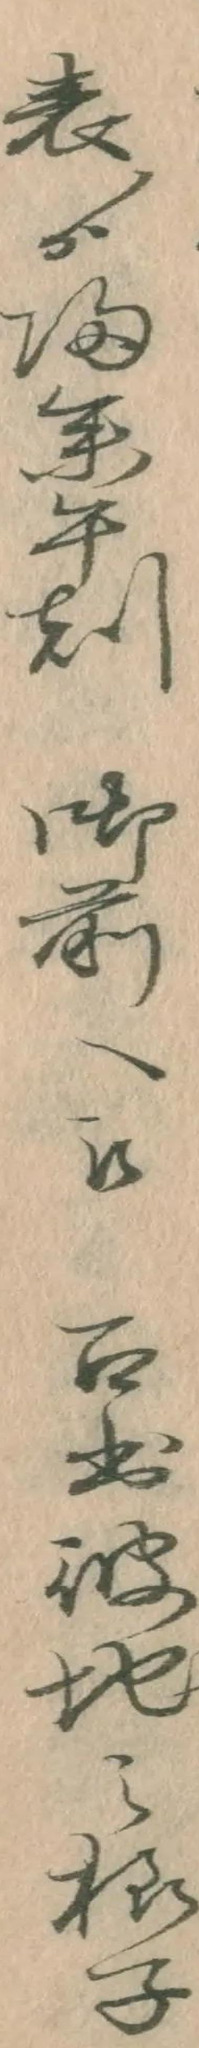表ゟ帰参午刻御前へ被召出彼地之様子
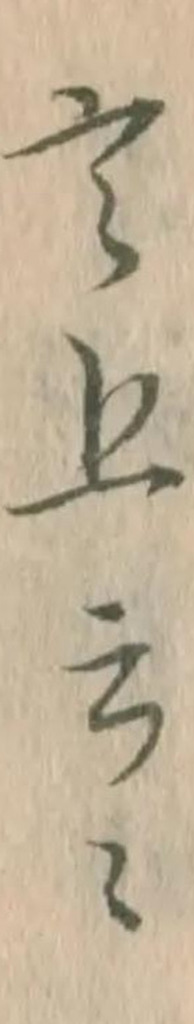言上云々
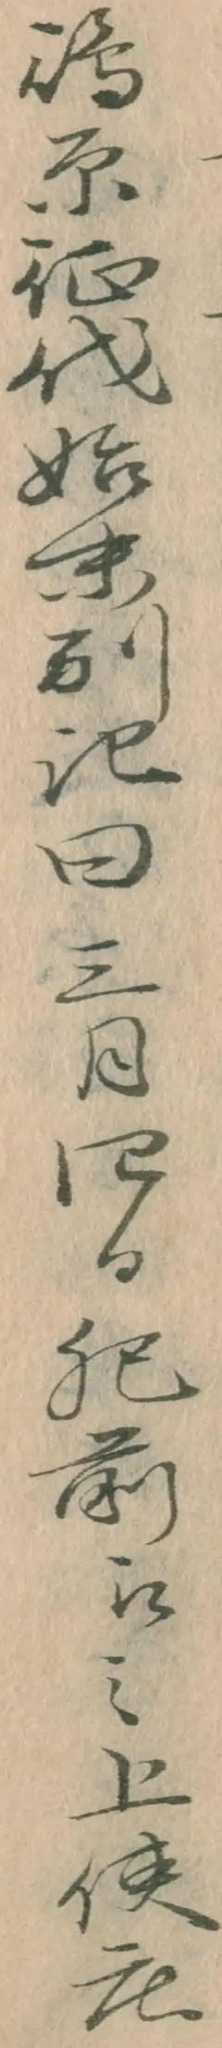島原征伐始末別記曰三月四日肥前江之上使庄

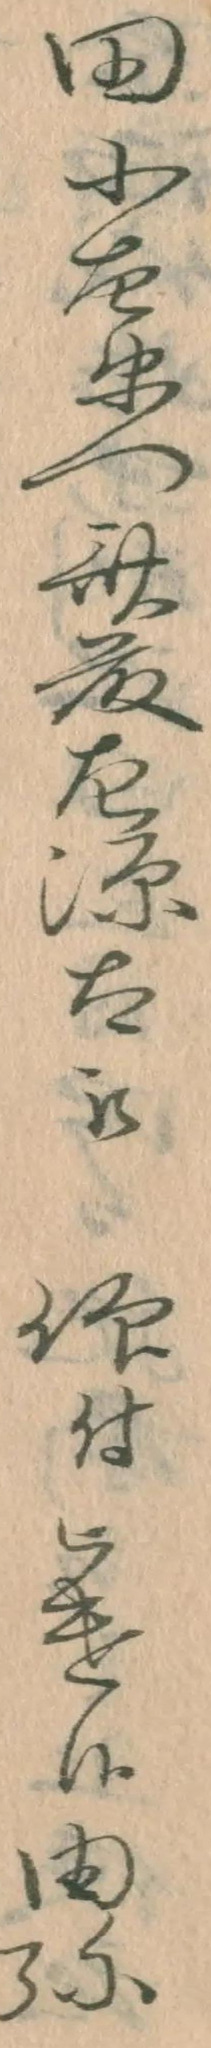田小左衛門斎藤左源太被仰付被遣候由弥
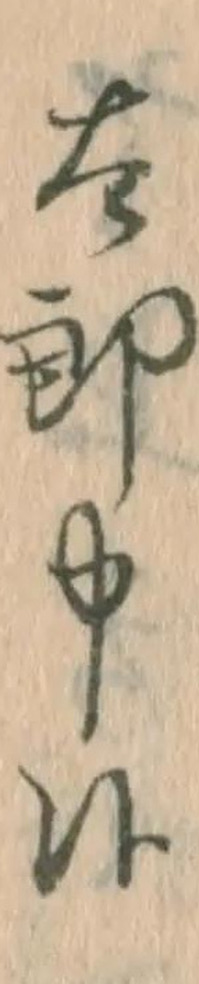太郎申候
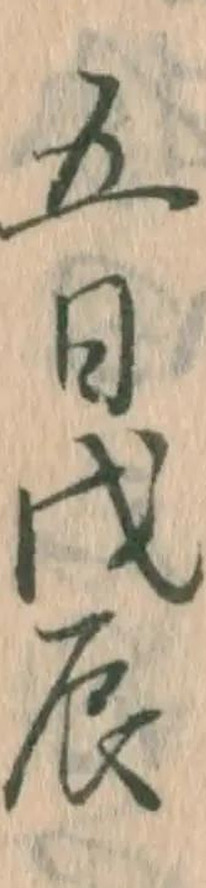五日戊辰
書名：切支丹御退治記 49巻. [9]
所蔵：国立国会図書館 National Diet Library, JAPAN
